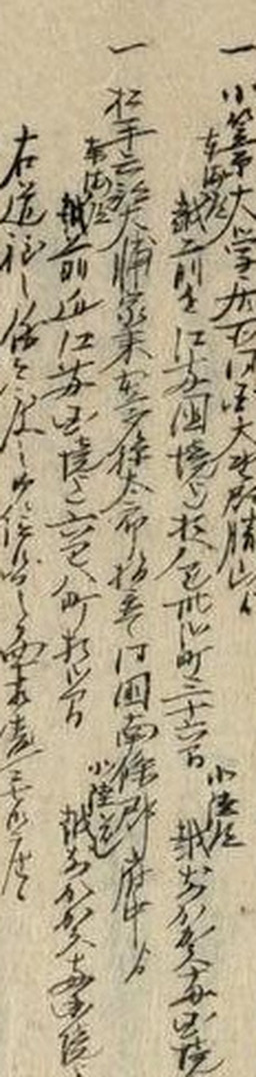一松平兵部大輔家来本多孫太郎指置候同国南条郡府中ゟ
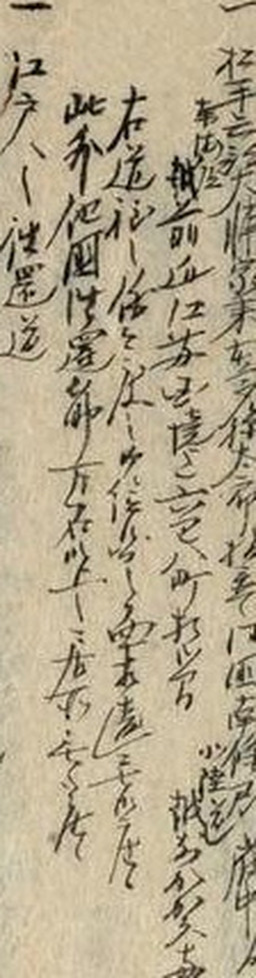右道程之儀今度之御絵図之面相違無御座候
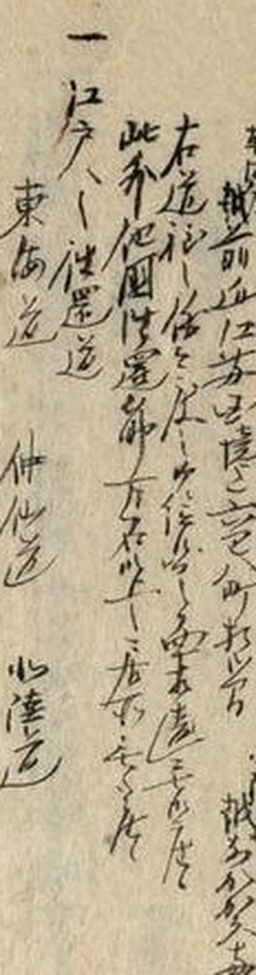此外他国往還筋ノ万石以上之居所無御座候
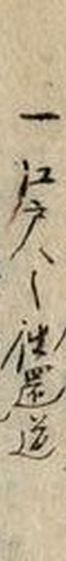一江戸へ之往還道
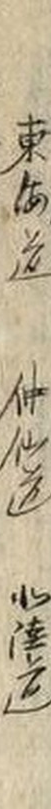東海道仲仙道北陸道
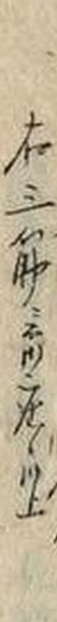右三筋ニ而御座候以上
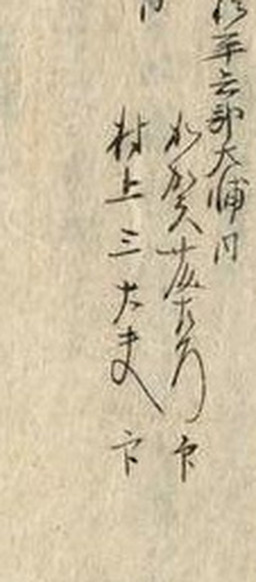同村上三太夫印

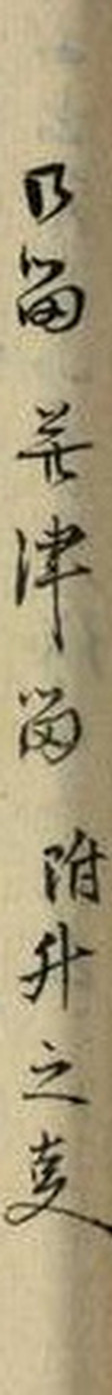口留幷津留附升之事
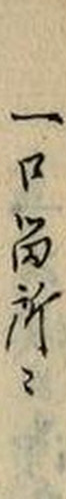一口留所々
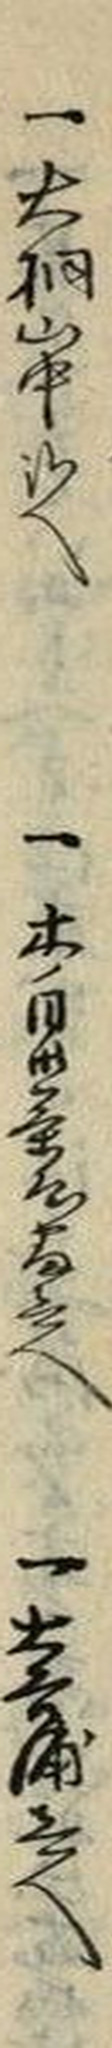一大桐山中弐人一木ノ目御茶屋番壱人一大谷浦壱人
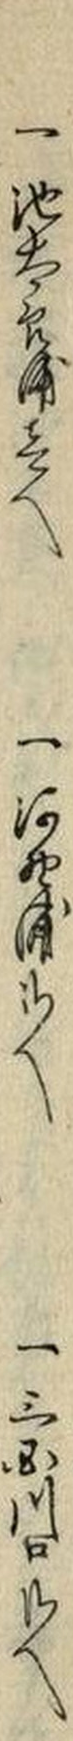一池太良浦壱人一河野浦弐人一三国川口弐人
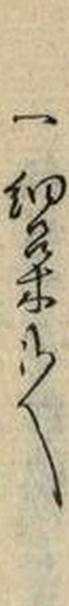一細呂木弐人
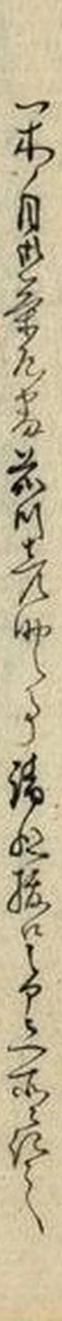一木ノ目御茶屋番前川彦助之事諸組抜口之部ニ一所ニ記之
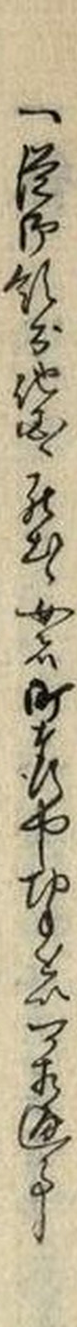一従御領分他国へ罷出候女者町奉行中切手を以可相通候事
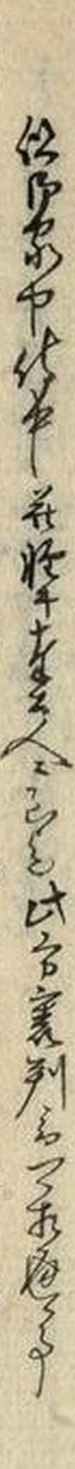但御家中侍中幷軽キ奉公人ニ至迄此方裏判ニ而可相通候事
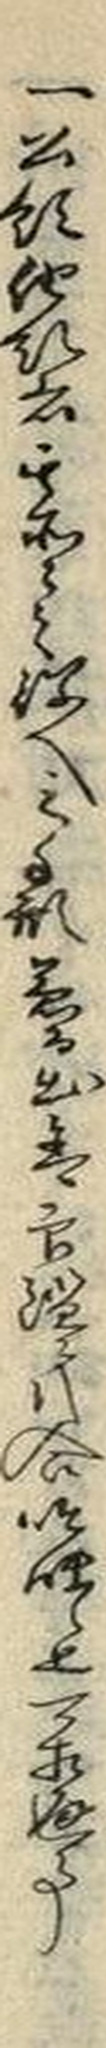一公領他領者其所々之役人之手形兼而出置候印鑑ニ引合吟味之上可相通候事
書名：御国他国諸事之部
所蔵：福井県文書館 Fukui Prefectural Archives
